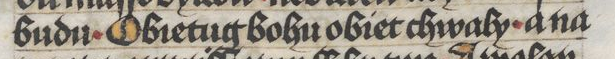budu.Obietug bohu obiet chwaly.a na
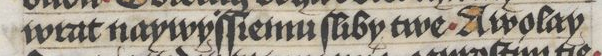wrat naywyẛſiemu ſliby twe.A wolay
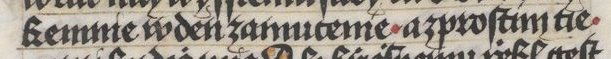kemníe w den zamuceníe.a zproſtím tie.
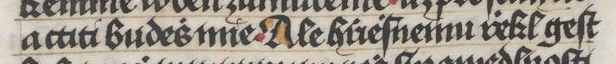a ctiti budeṡ mie.Ale hṙieẛnemu ṙekl geſt
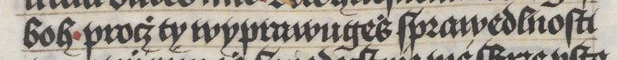boh.procż ty wyprawugeṡ ſprawedlnoſtí
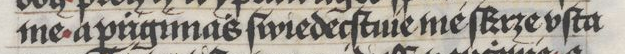me.a pṙigímaṡ ſwiedecſtuíe me ſkrze vſta
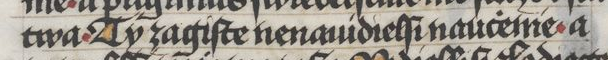twa.Ty zagiſte nenaudielſi nauċeníe.a
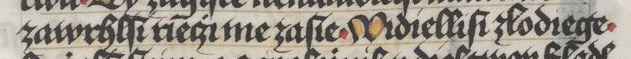zawrhlſi riecżi me zaſie.Vidíelliſi zlodiege.
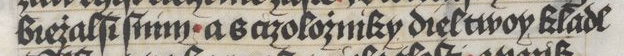bieżalſi ſním.a s acizolożniky díel twoy kladl
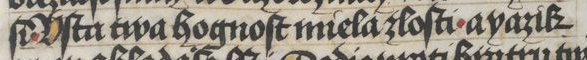ſi.Vſta twa hognoſt miela zloſti.a yazik
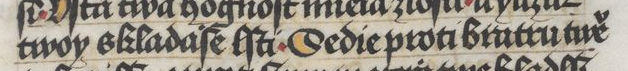twoy skladaẛe lſti.Sedie proti bratru twev
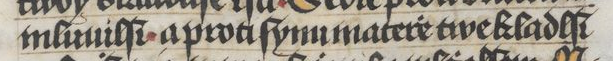mluuilſi.a proti ſynu maceře twe kladlſi
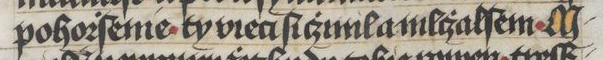pohorẛeníe.ty vieci ſi cžinila mlcžalſem.M¬
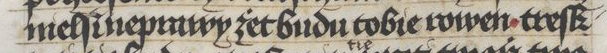nielſi neprawy žet budu tobie rowen.treſk¬
